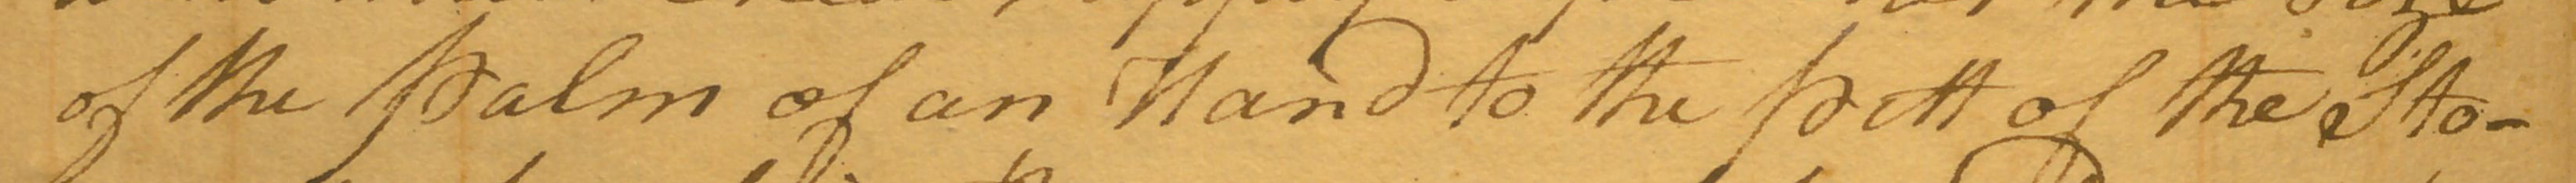of the Palm of an hand to the pitt of the Sto-
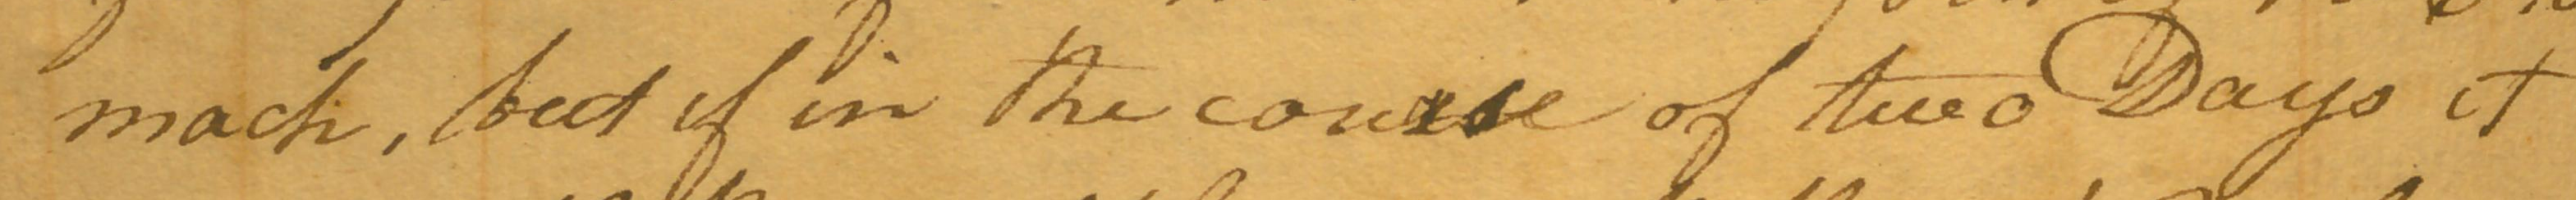mach, but if in the course of two Days it
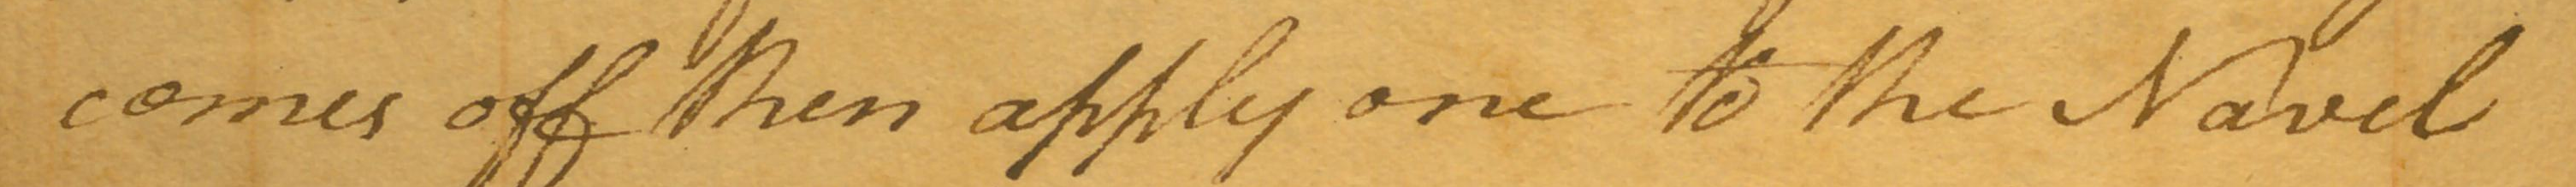comes off then apply one to the Navel
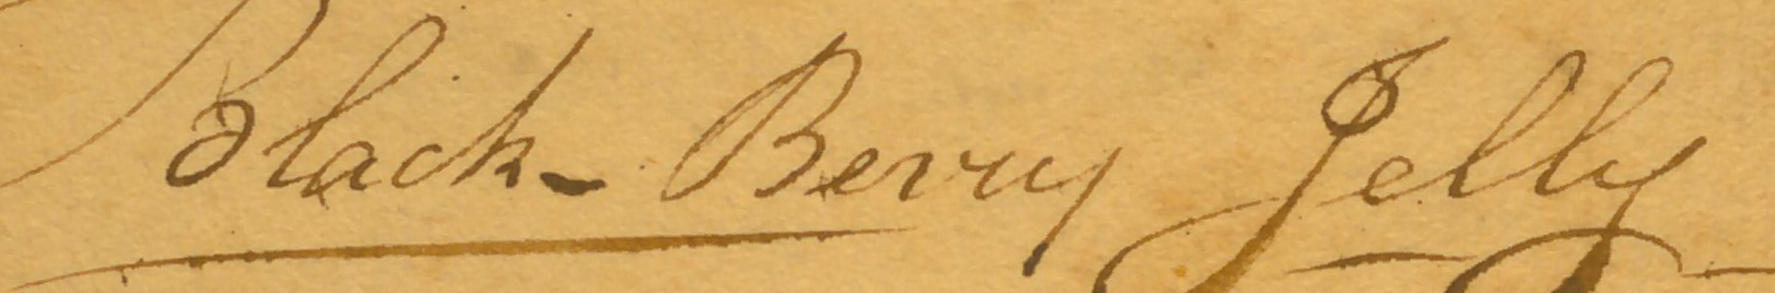Black-Berry Jelly
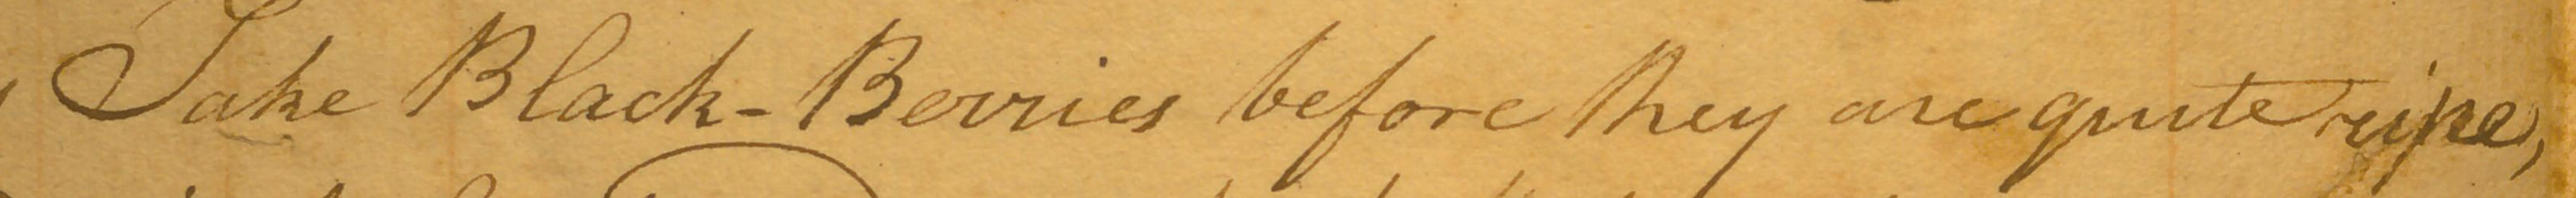Take Black-Berries before they are quite ripe,
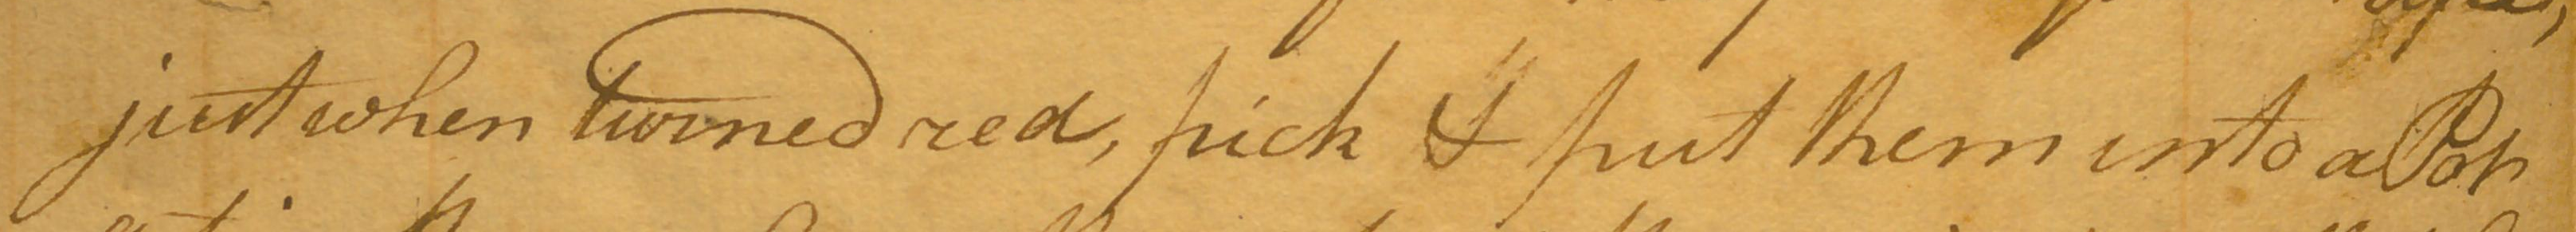just when turned red, pick & put them into a Pot
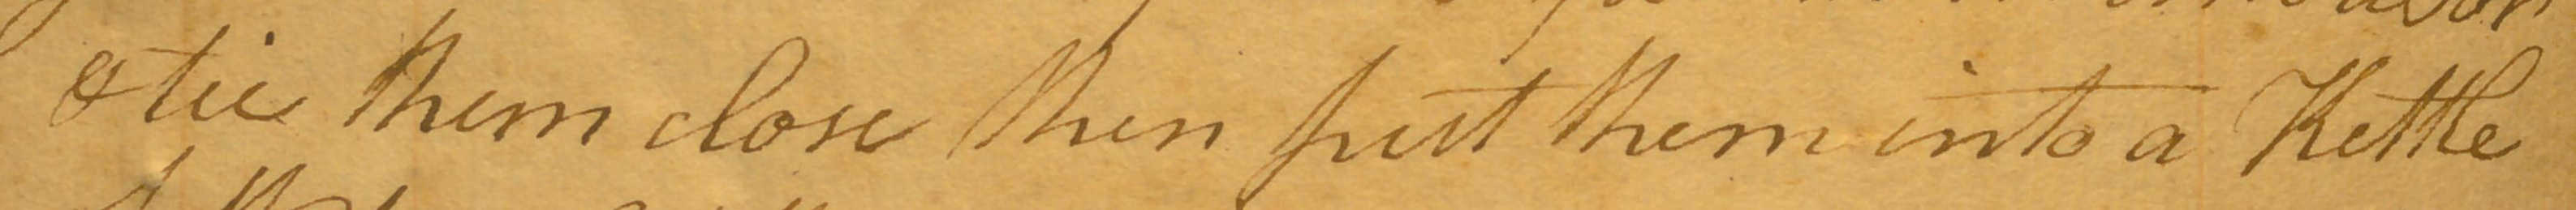& tie them close then put them into a Kettle
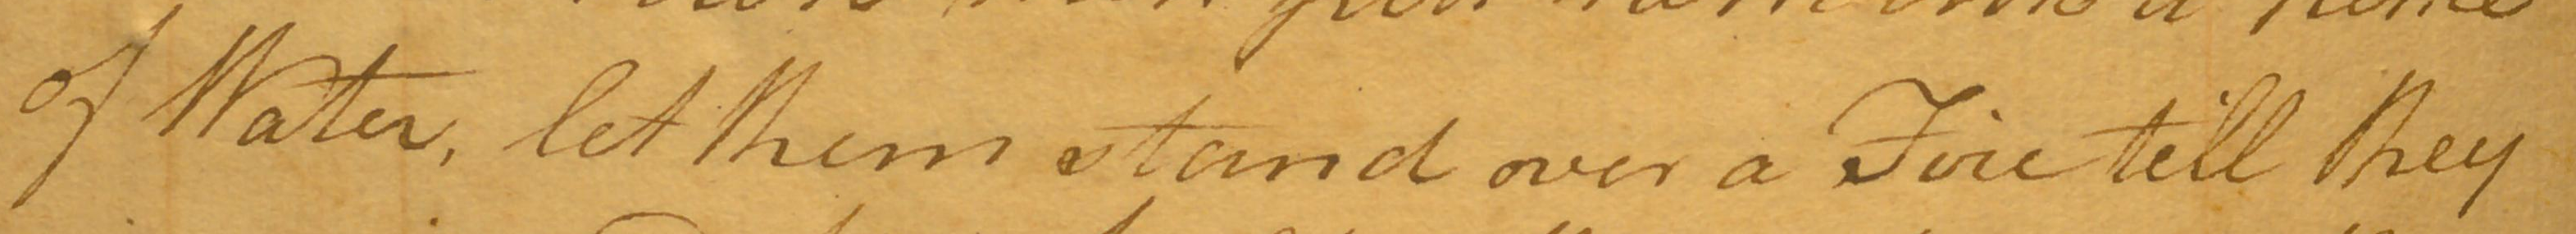of Water, let them stand over a Fire till they
